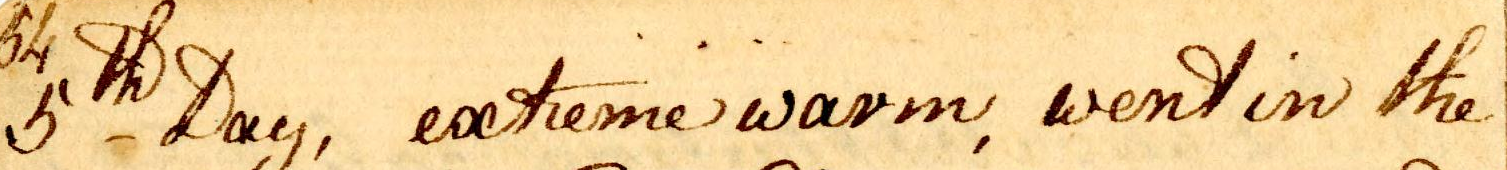5^th Day, extreme warm, went in the
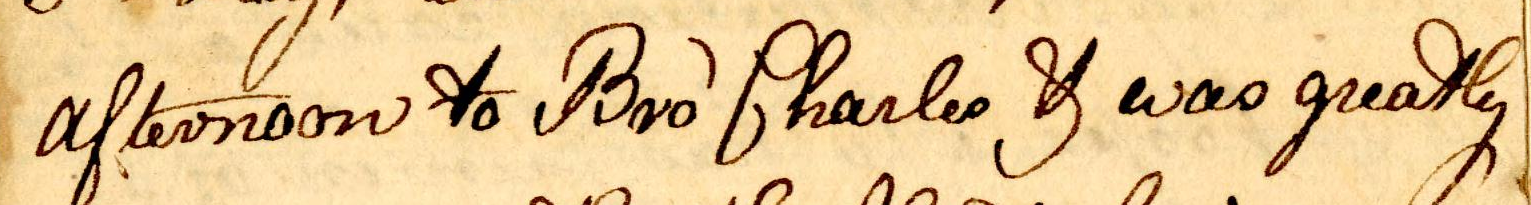Afternoon to Bro' Charles & was greatly
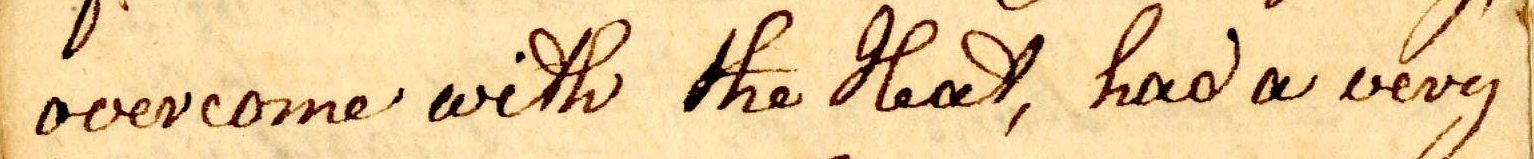overcome with the Heat, had a very
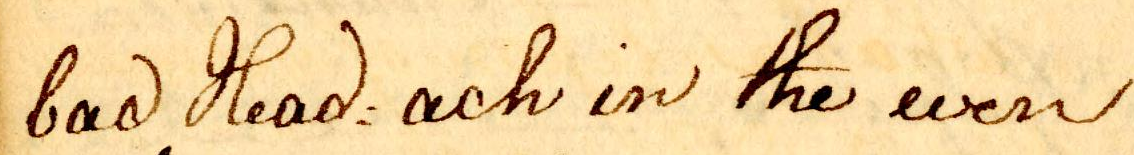bad Head-ach in the even
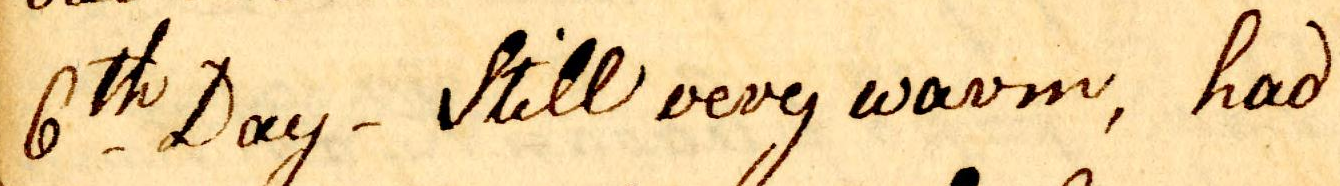6^th Day- Still very warm, had
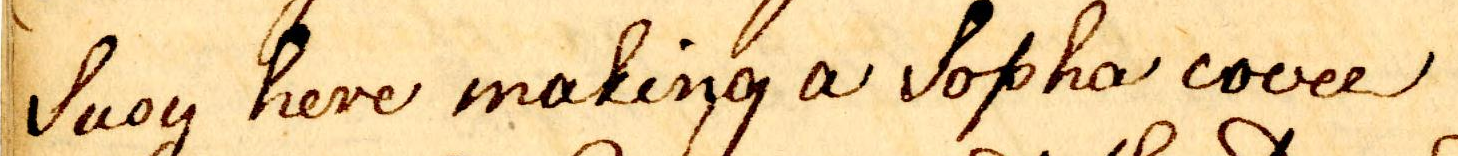Susy here making a Sopha cover
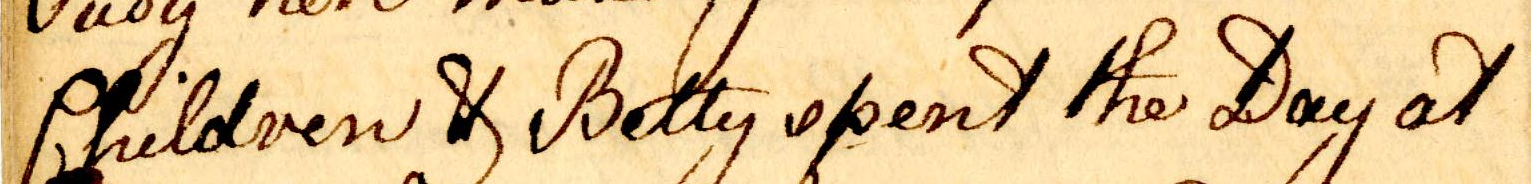Children & Betty spent the Day at
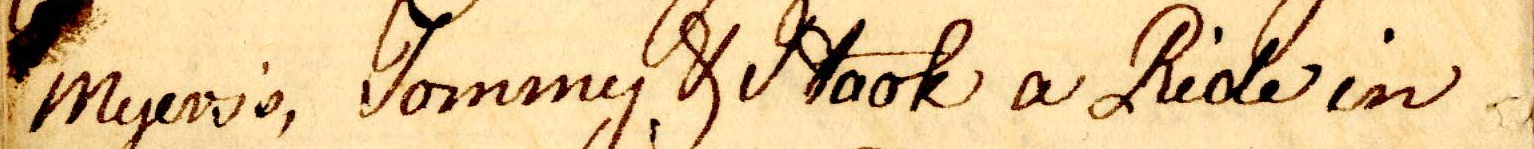Myers's, Tommy & I took a Ride in
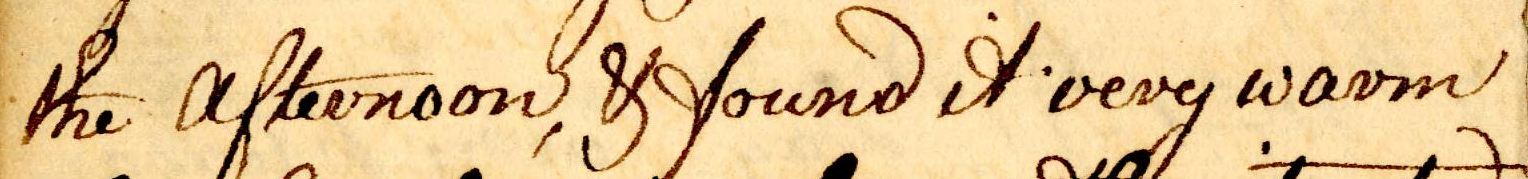the Afternoon, & found it very warm
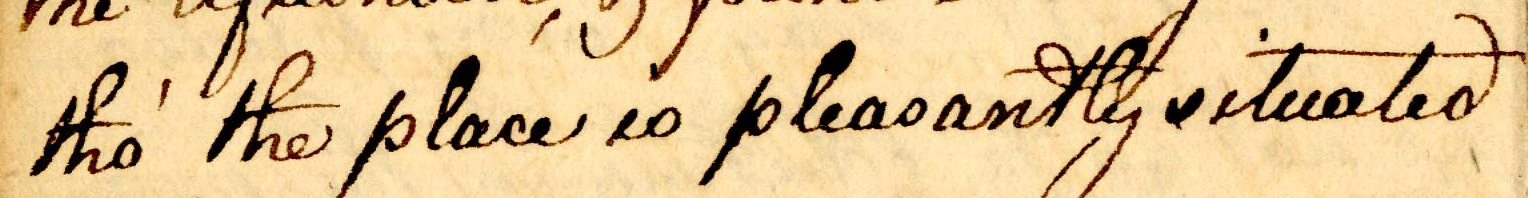tho' the place is pleasantly situated
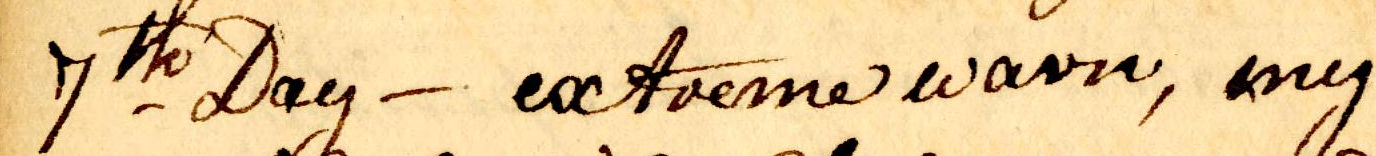7^th Day- extreme warm, my
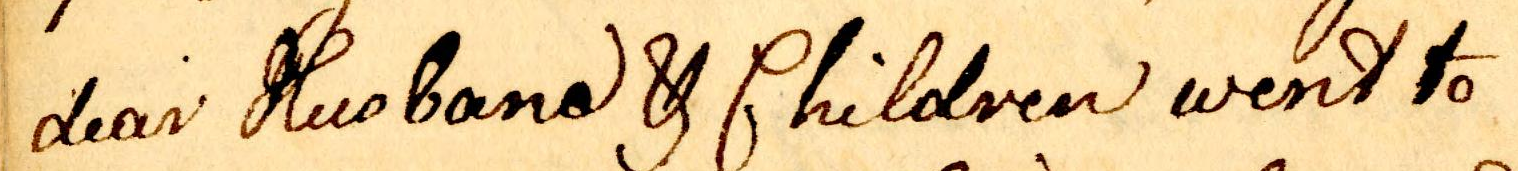dear Husband & Children went to
